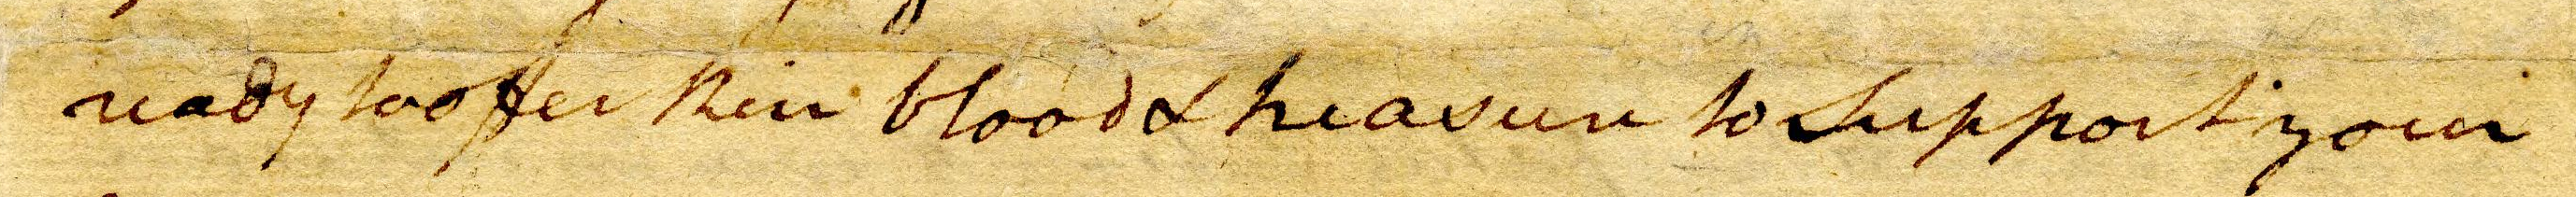ready to offer their blood & treasure to support your
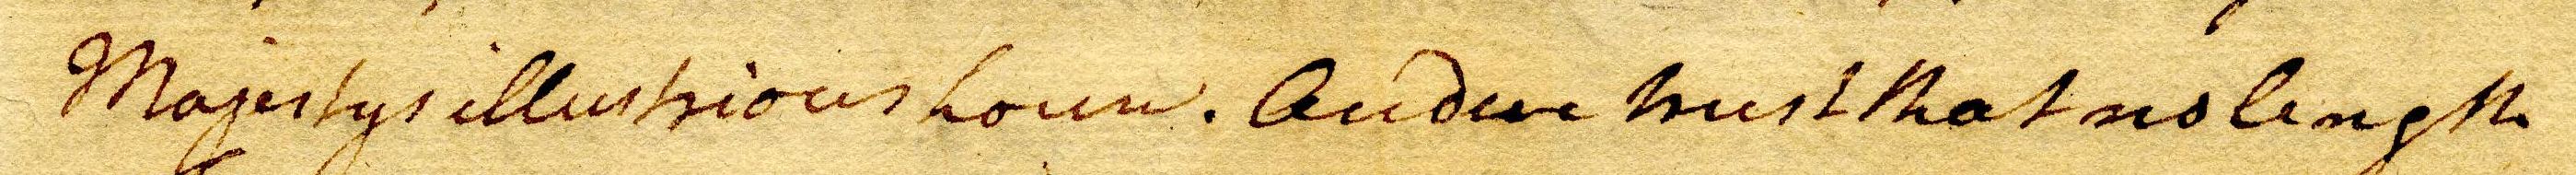Majesty's illustrious house. And we trust that no length
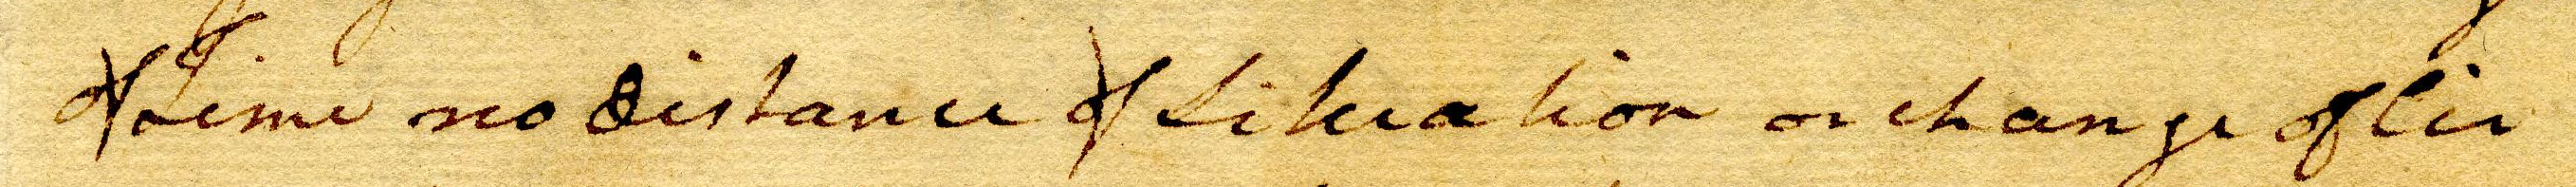of time no distance of Situation or change of Cir
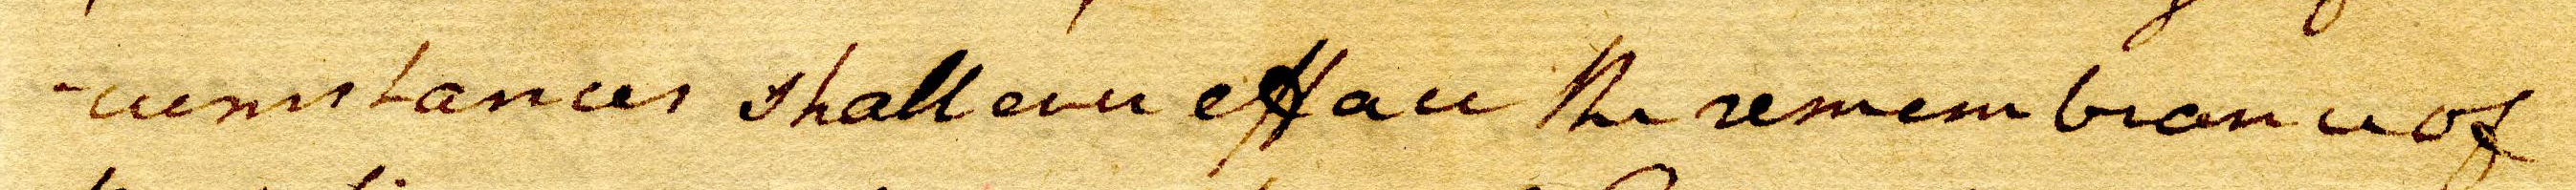-cumstances shall ever efface the remembrance of
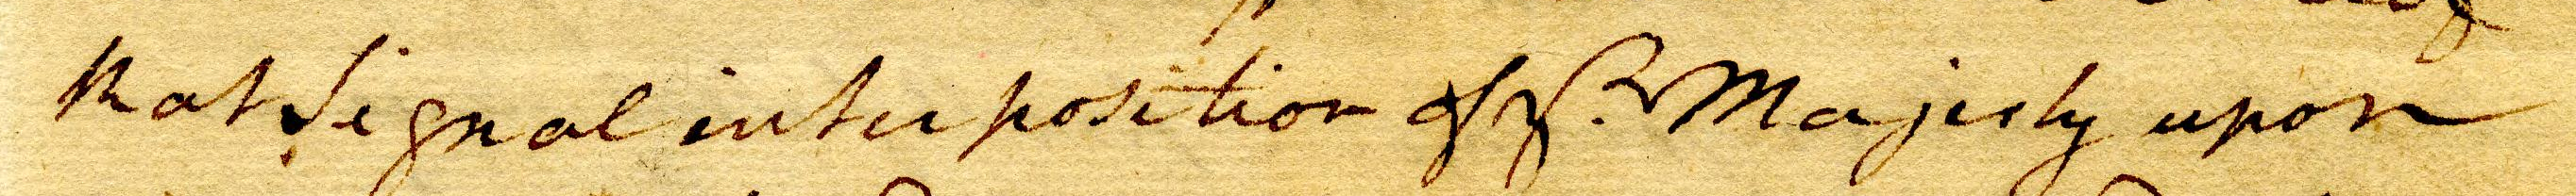that signal interposition of y^r. Majesty upon
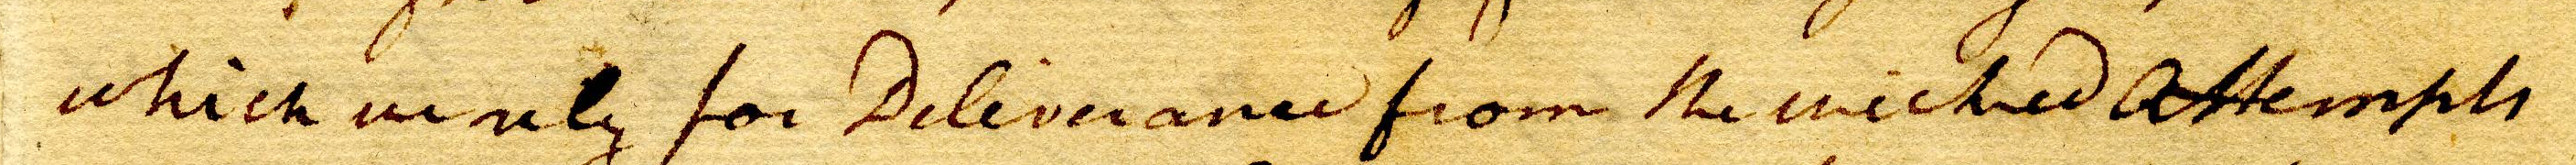which we rely for Deliverance from the wicked Attempts
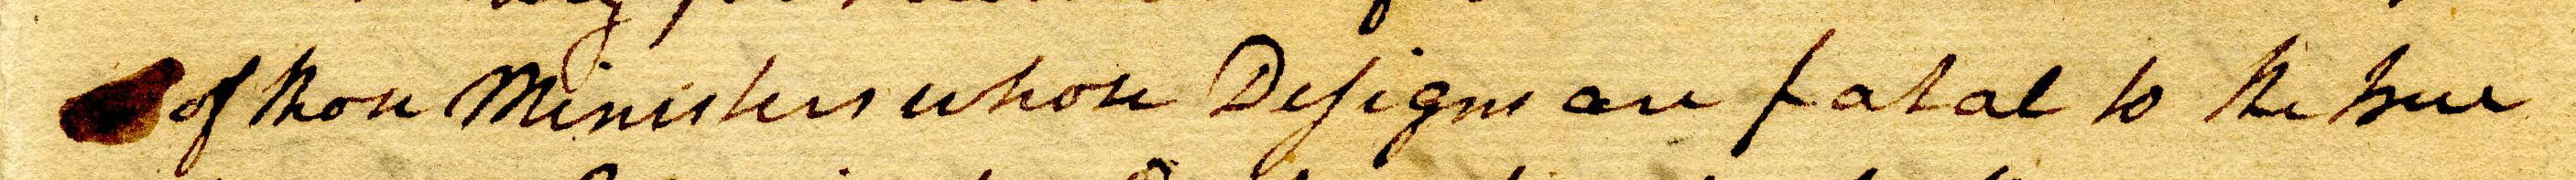of those Ministers whose Designs are fatal to the pure
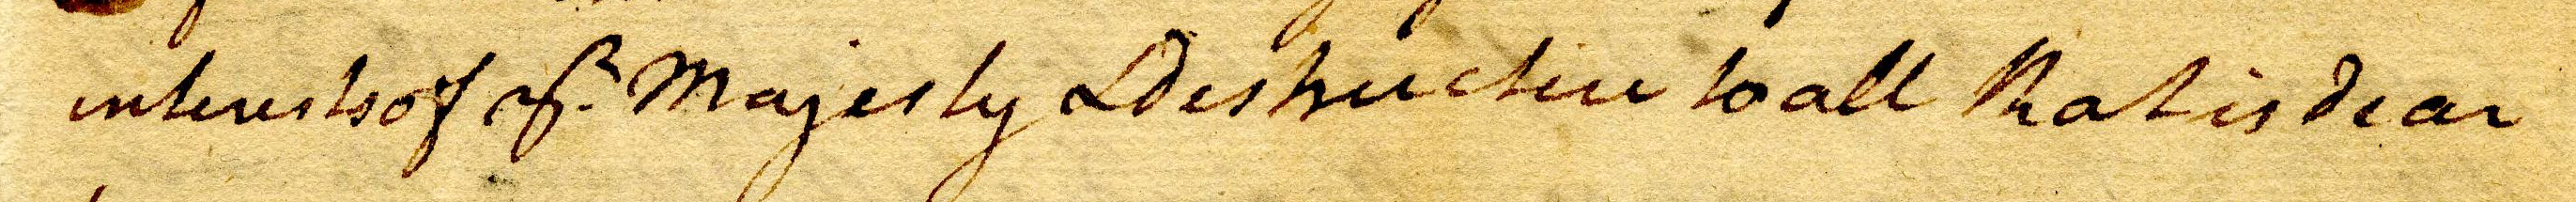intentions of y^r. Majesty Destructive to all that is dear
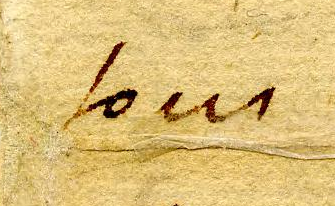to us
